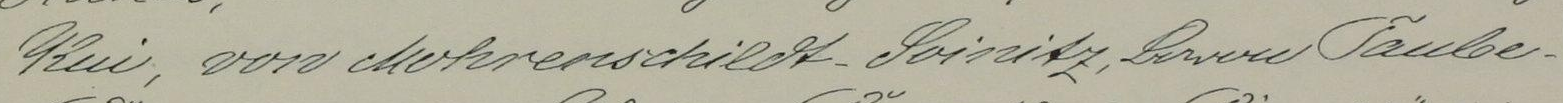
Kui, von Mohrenschildt-Soinitz, Baron Taube-
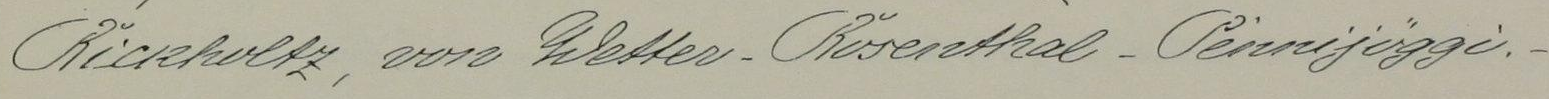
Rickholtz, von Wetter-Rosenthal-Pennijöggi.
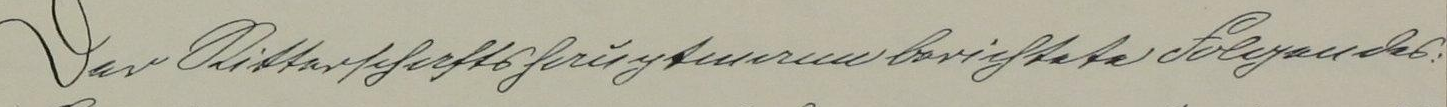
Der Ritterschaftshauptmann berichtete Folgendes:
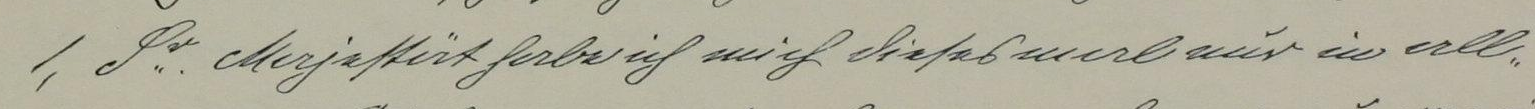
1. Sr. Majestät habe ich mich dieses Mal nur in all-
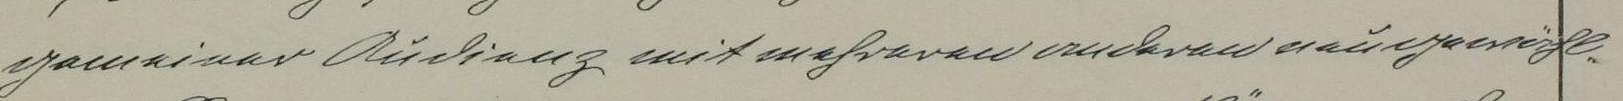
gemeiner Audienz mit mehreren anderen neugewähl-
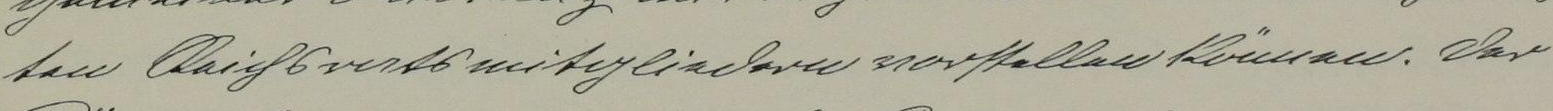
ten Reichsratsmitgliedern vorstellen können. Der
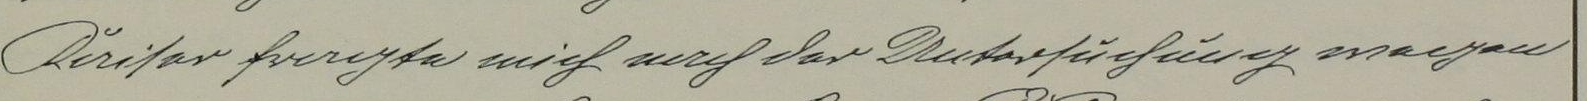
Kaiser fragte mich nach der Untersuchung wegen
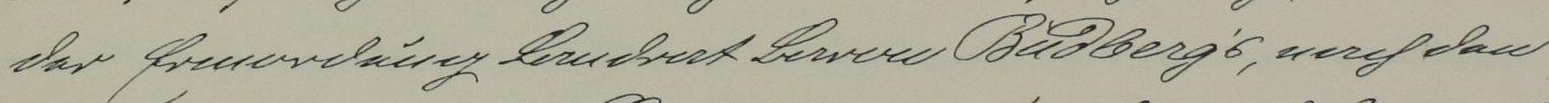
der Ermordung Landrat Baron Budberg's, nach den
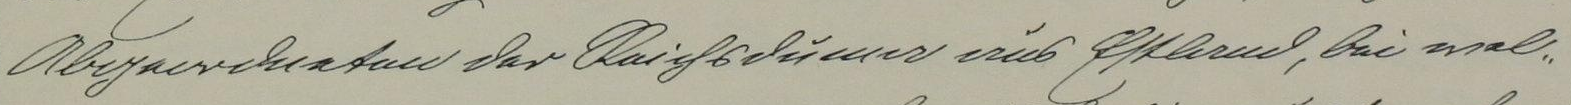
Abgeordneten der Reichsduma aus Estland, bei wel-
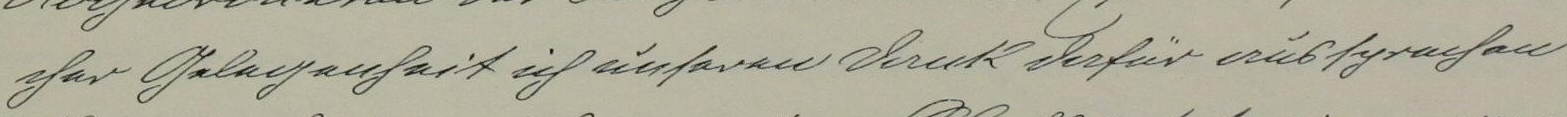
cher Gelegenheit ich unseren Dank dafür aussprechen
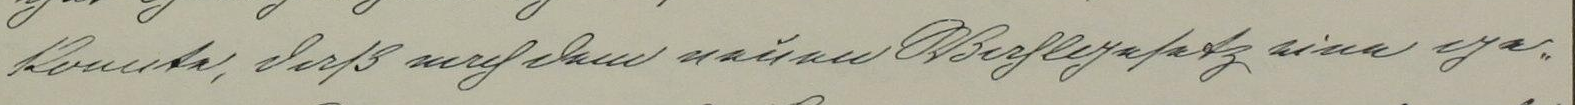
konnte, daß nach dem neuen Wahlgesetz eine ge-
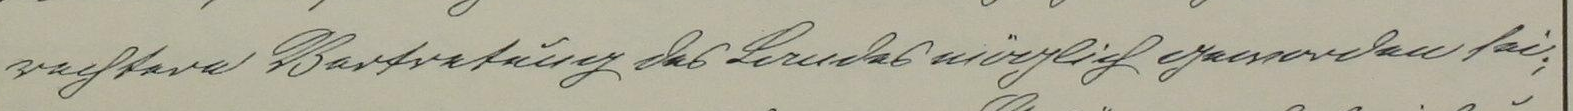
rechtere Vertretung des Landes möglich geworden sei;
